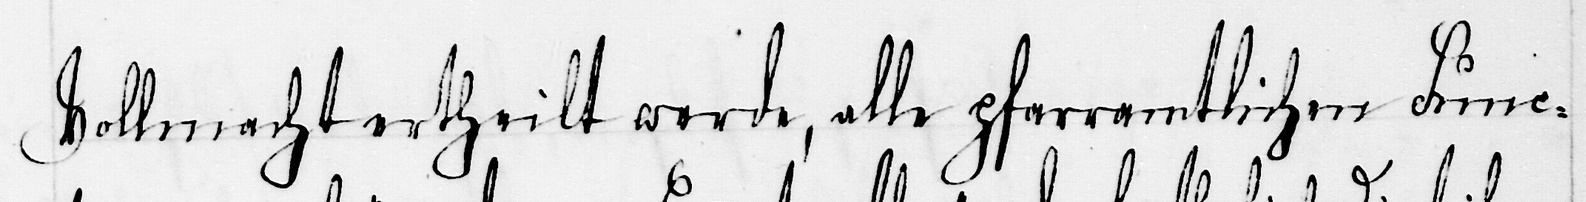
Vollmacht ertheilt werde, alle pfarramtlichen Func¬
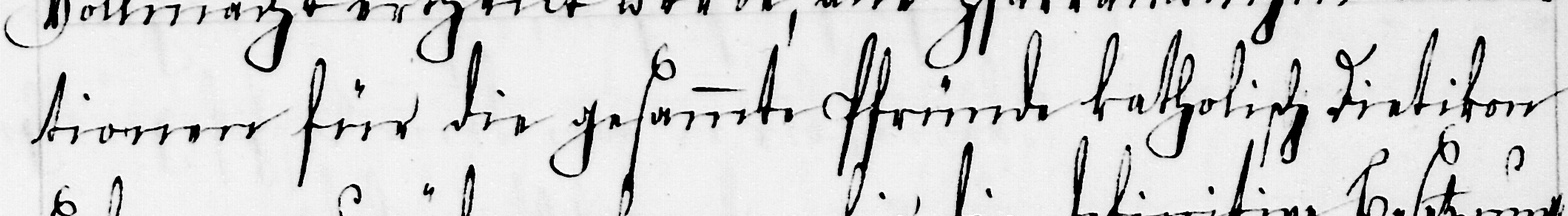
tionen für die gesammte Pfründe katholisch Dietikon
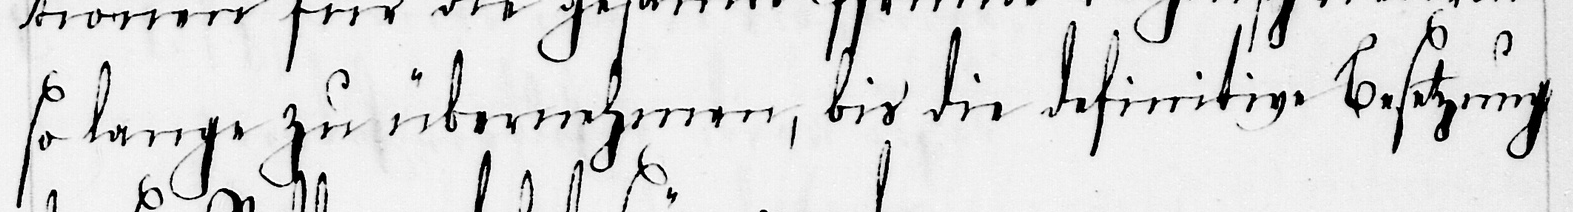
so lange zu übernehmen, bis die definitive Besetzung
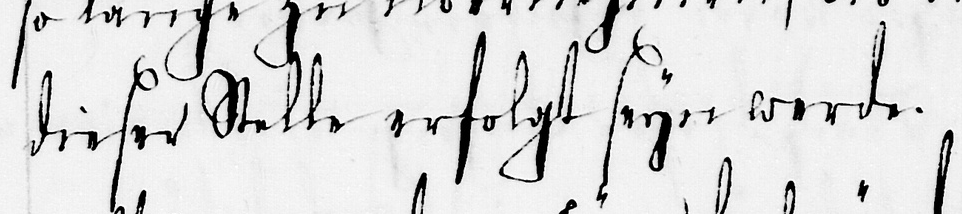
dieser Stelle erfolgt seyn werde.
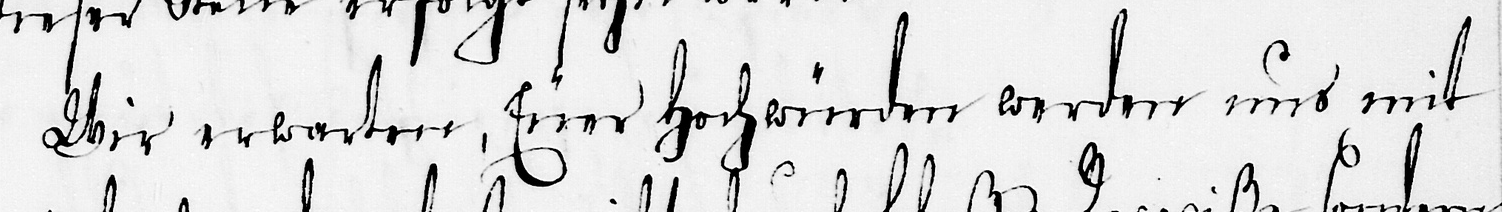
Wir erwarten, Euer Hochwürden werden uns mit
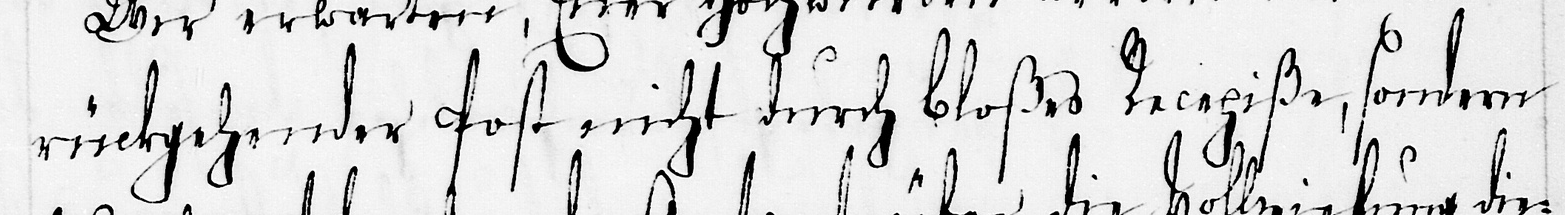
rückgehender Post nicht durch bloßes Recepiße, sondern
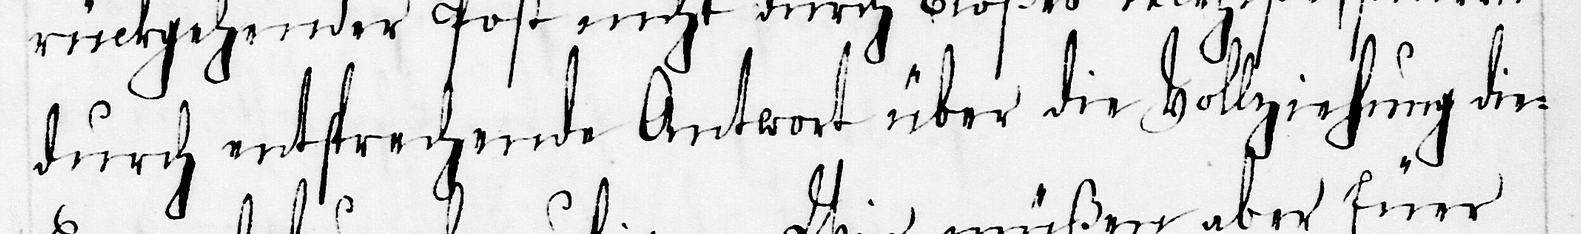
durch entsprechende Antwort über die Vollziehung die¬
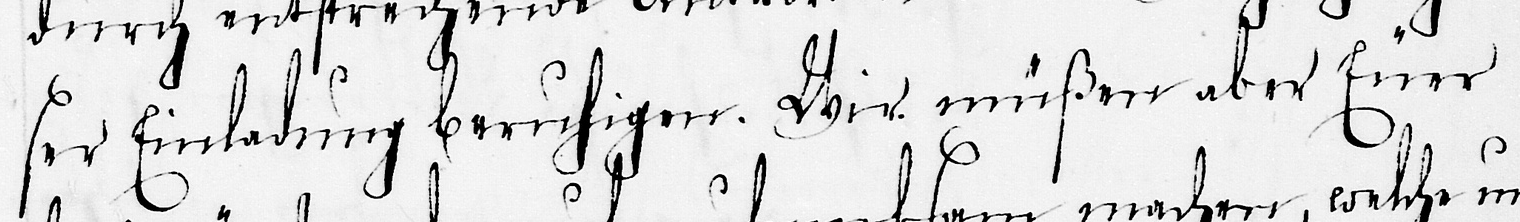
ser Einladung beruhigen. Wir müßen aber Euer
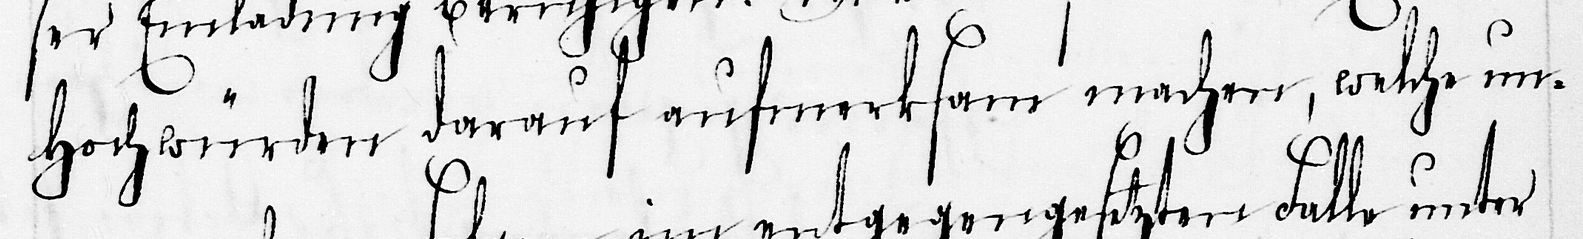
Hochwürden darauf aufmerksam machen, welche un¬
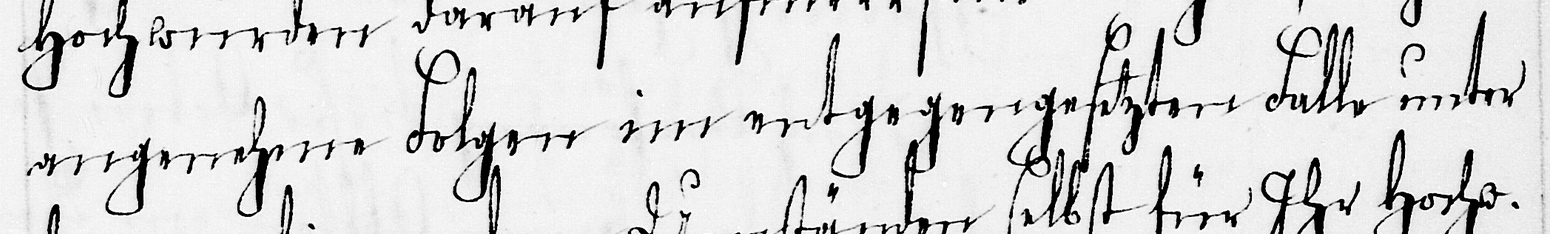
angenehme Folgen im entgegengesetzten Falle unter
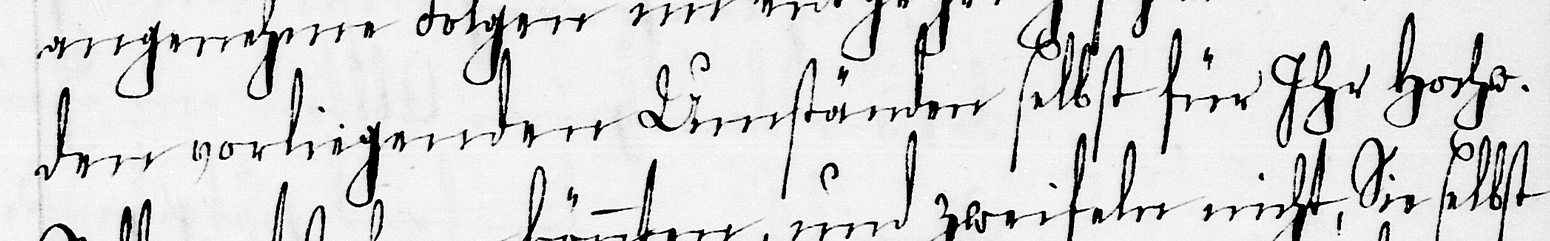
den vorliegenden Umständen selbst für Ihr Hochw.
